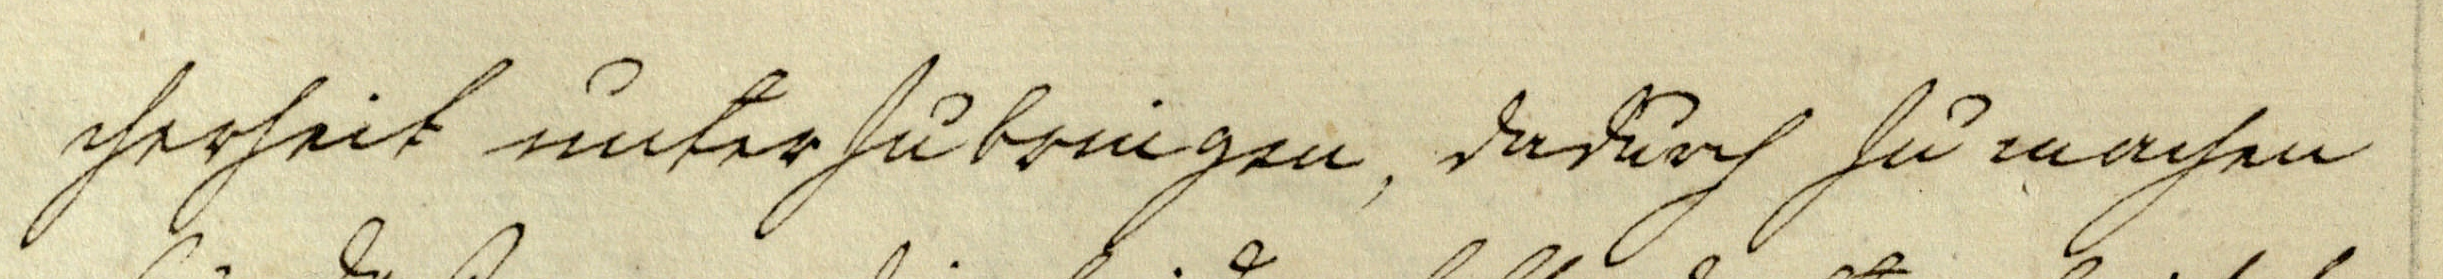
cherheit unterzubringen, dadurch zu machen
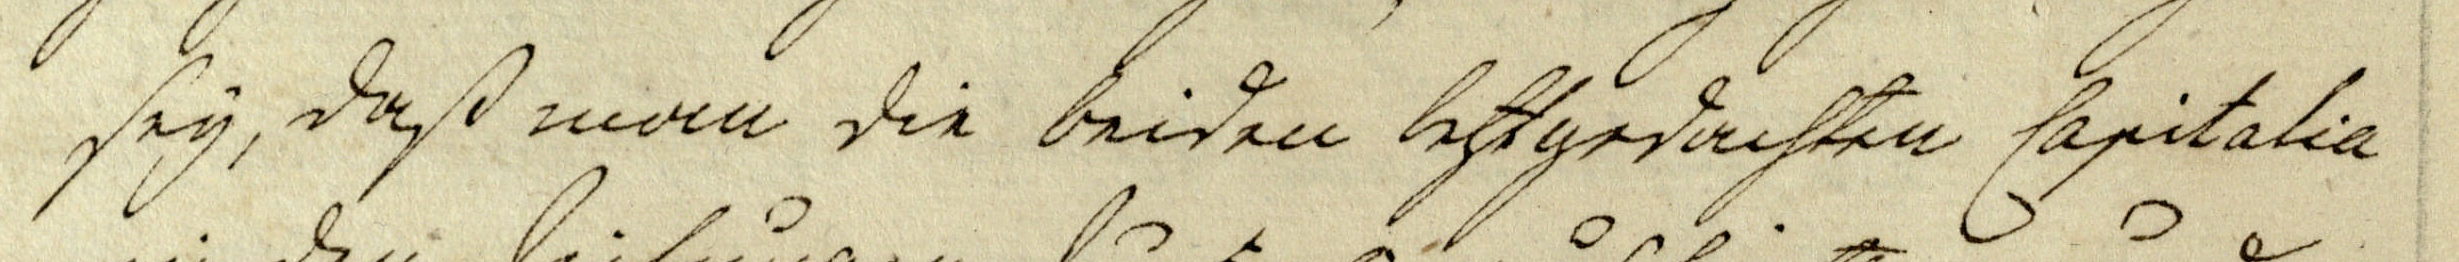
seÿ, daß man die beiden letztgedachten Capitalia
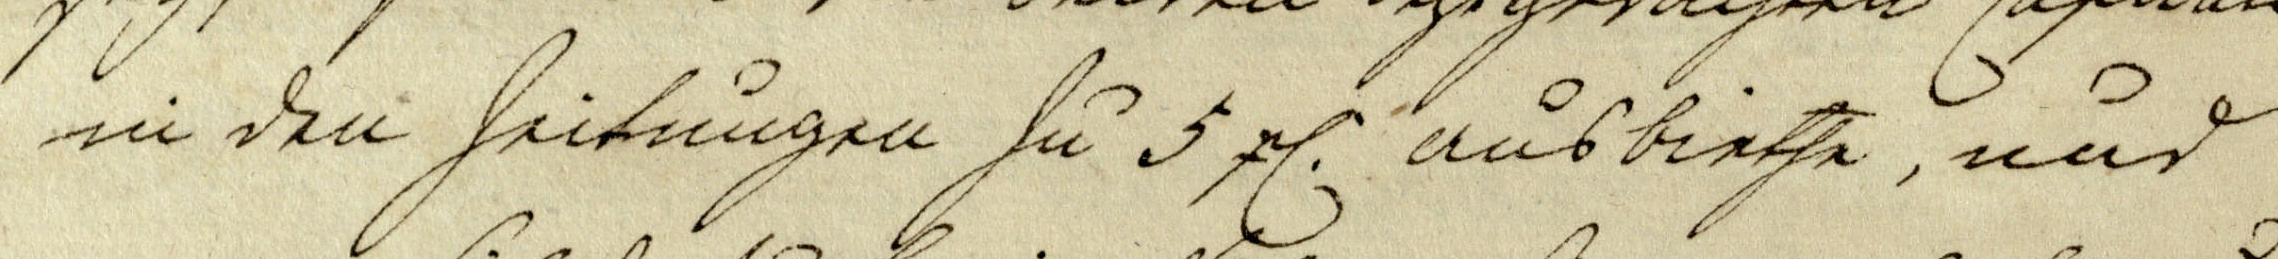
in den Zeitungen zu 5 pl. ausbiethe, und
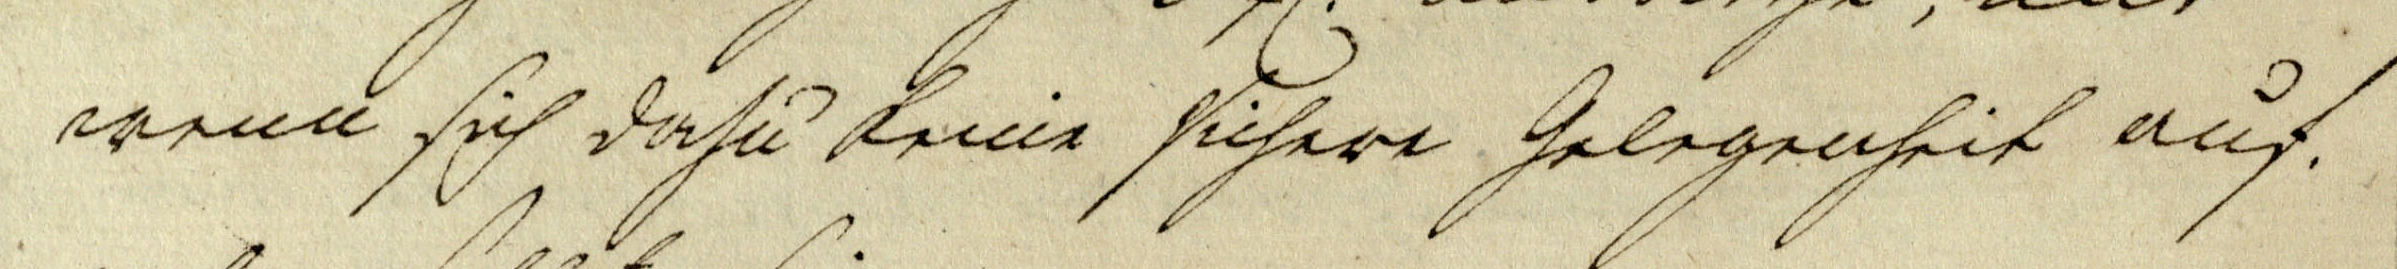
wenn sich dazu keine sichere Gelegenheit auf¬
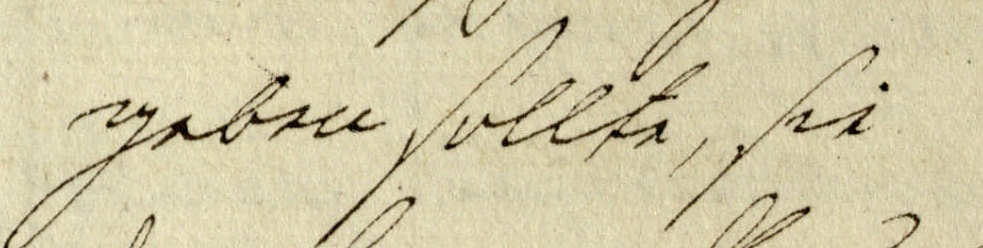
geben sollte, sie
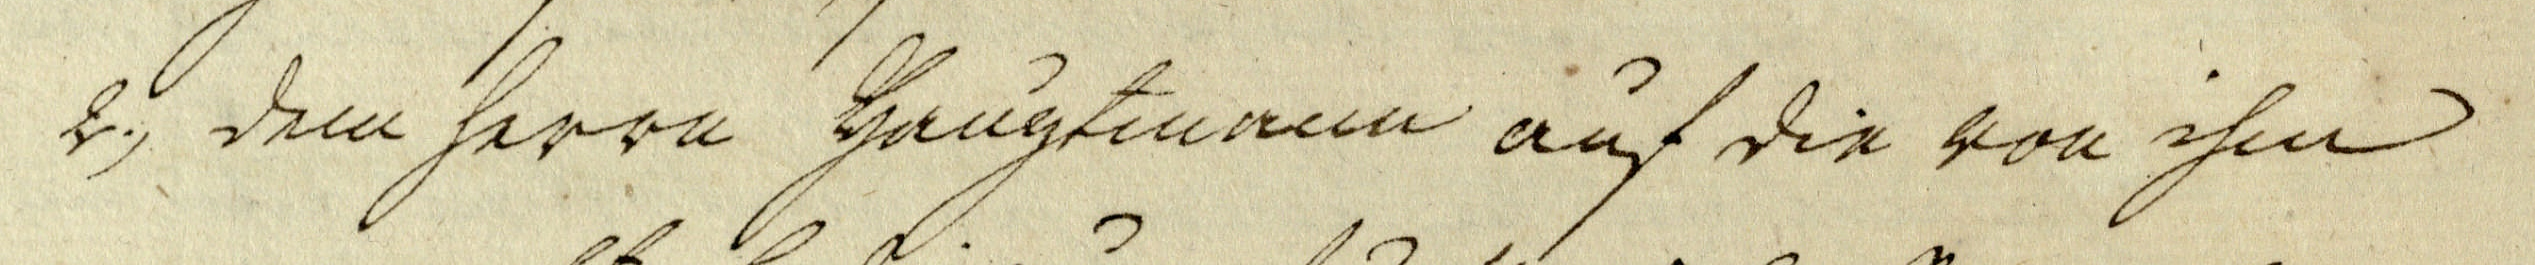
2, dem Herrn Hauptmann auf die von ihm
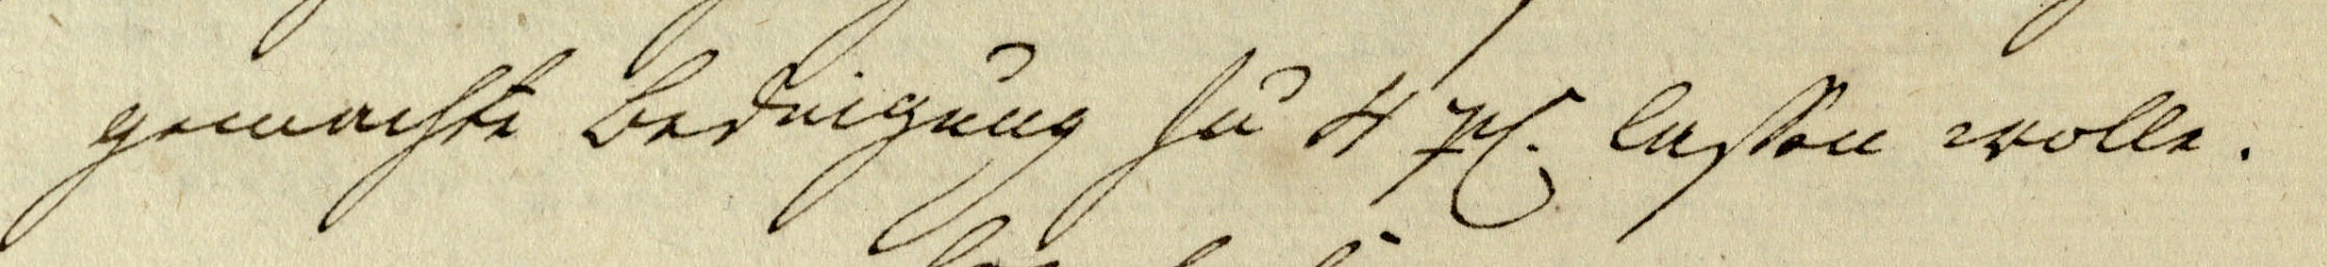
gemachte Bedingung zu 4 pl. lassen wolle.
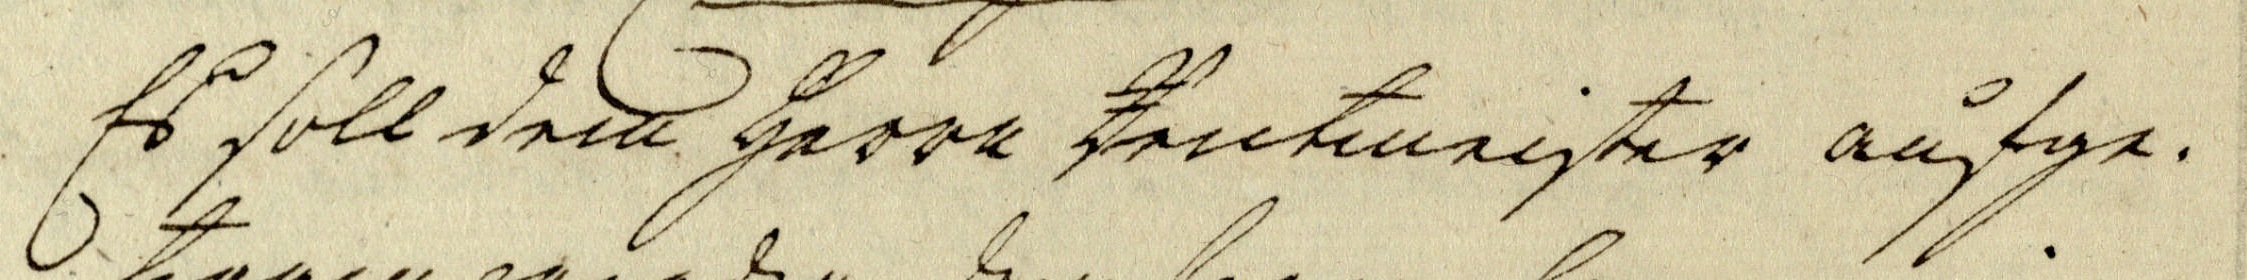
Es soll dem Herrn Rentmeister aufge¬
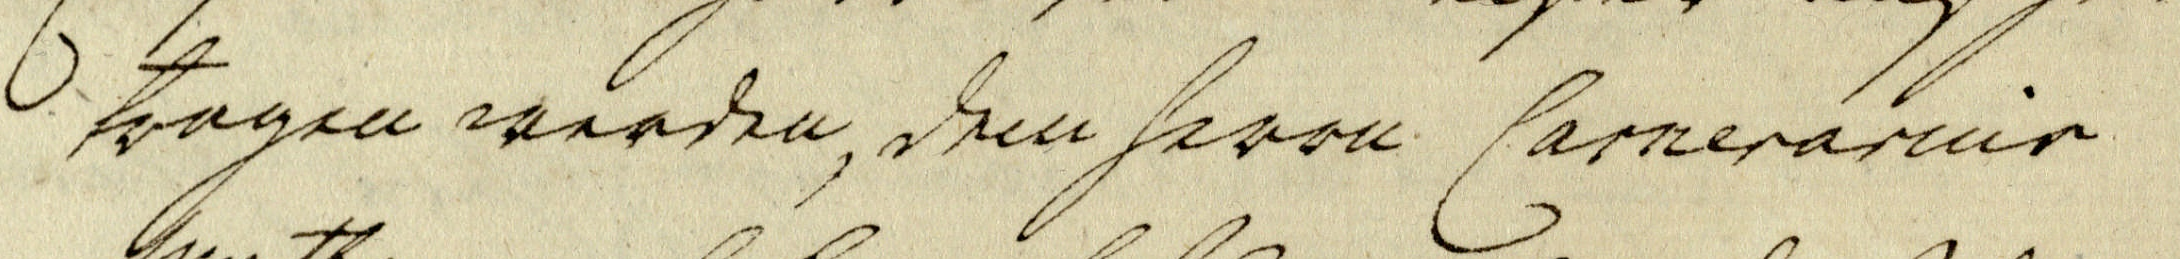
tragen werden, dem Herrn Camerarius
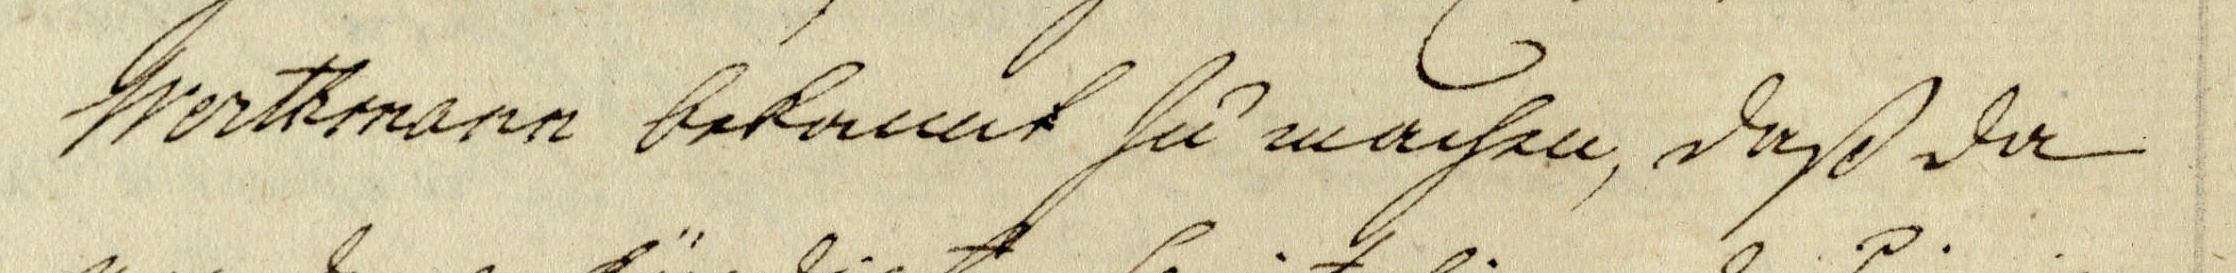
Werthmann bekannt zu machen, daß da
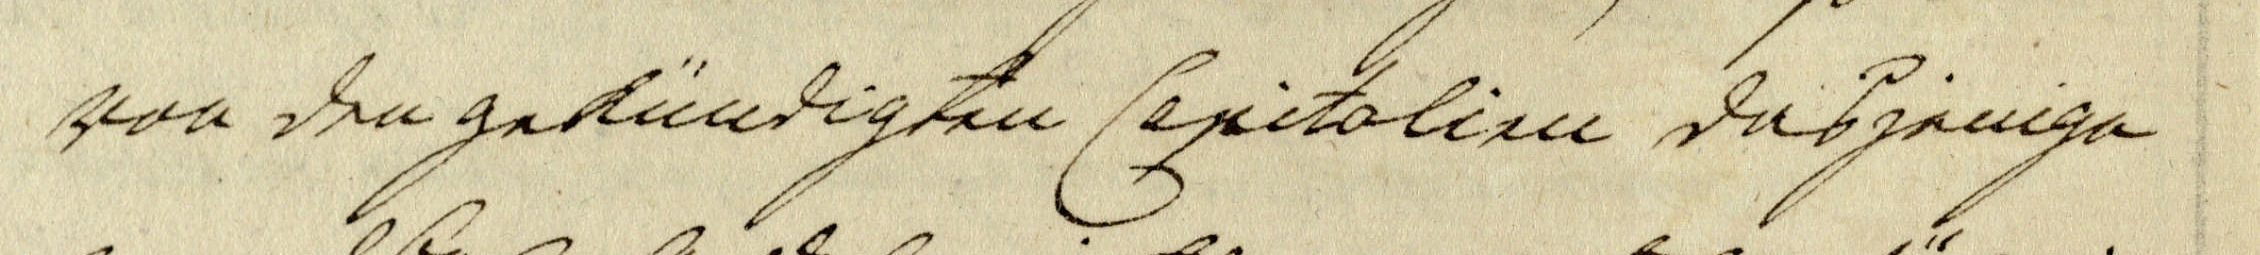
von den gekündigten Capitalien dasjenige
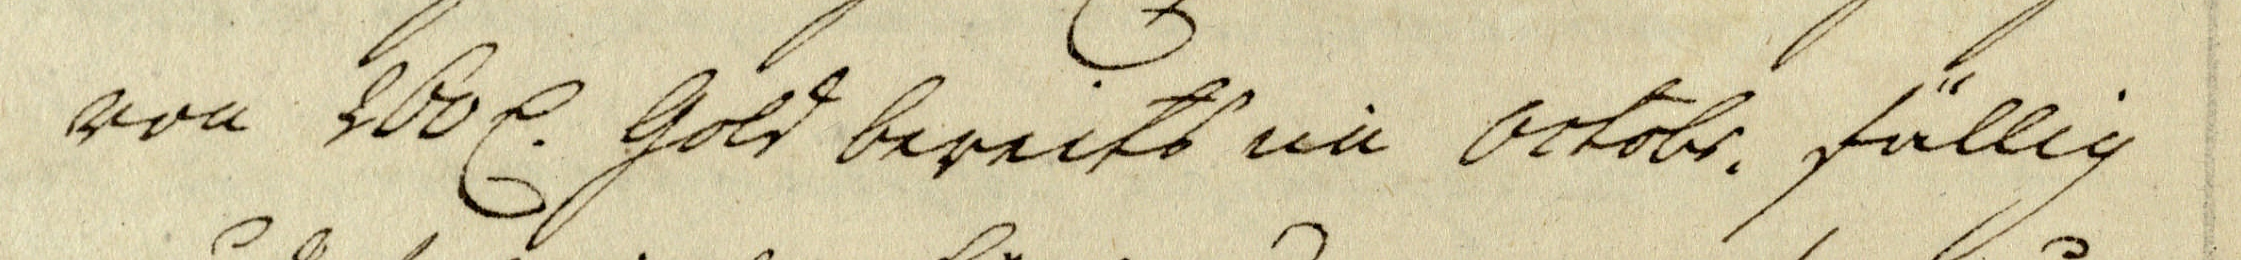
von 260 l. Gold bereits im Octobr. fällig
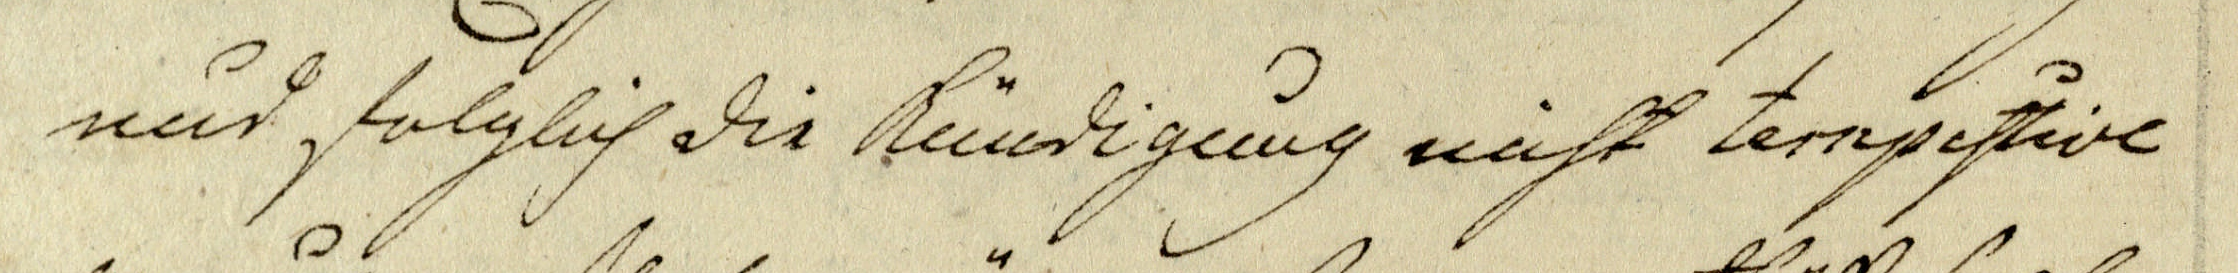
und folglich die Kündigung nicht tempestive
